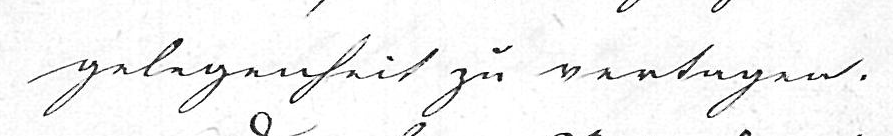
gelegenheit zu vertagen.
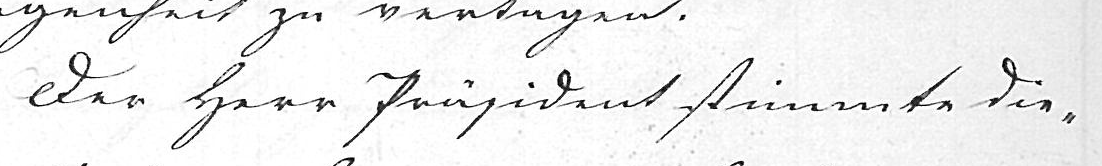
Der Herr Präsident stimmte die-
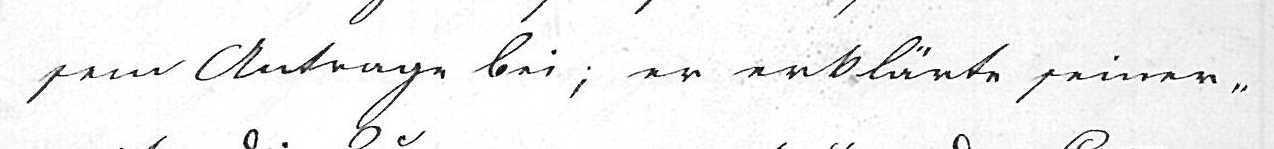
sem Antrage bei; er erklärte seiner-
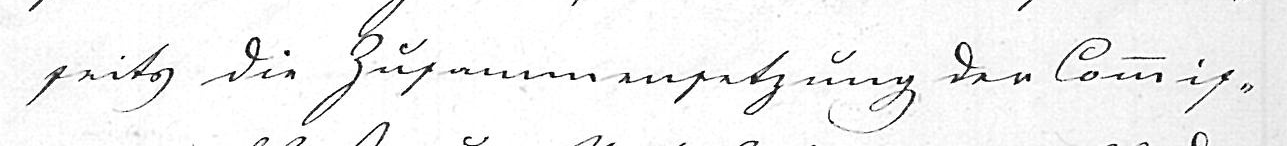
seits die Zusammensetzung der Commis-
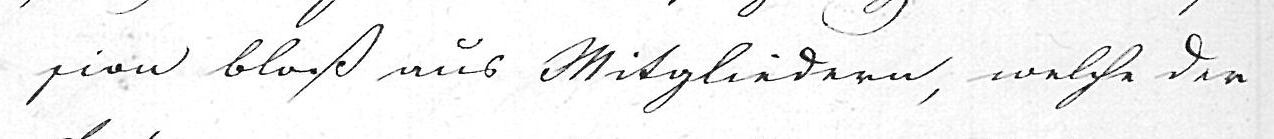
sion bloß aus Mitgliedern, welche der
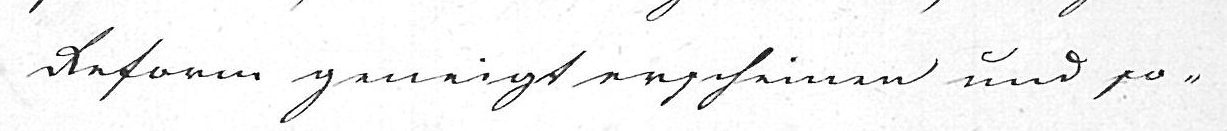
Reform geneigt erscheinen und so-
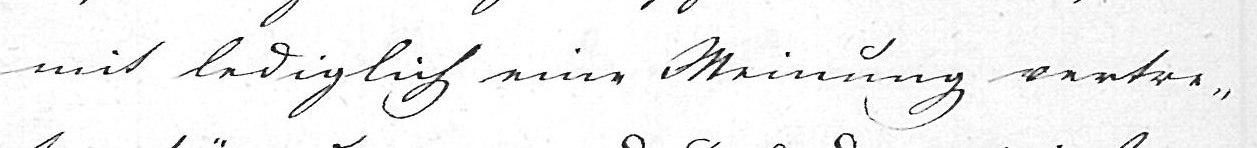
mit lediglich eine Meinung vertre-
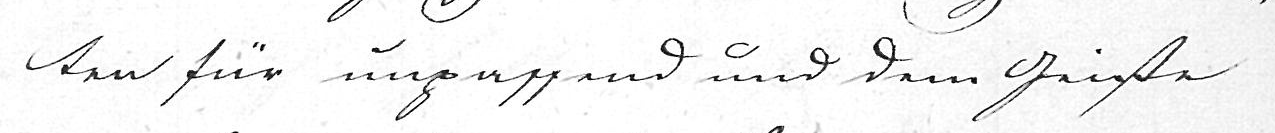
ten für unpassend und dem Geiste
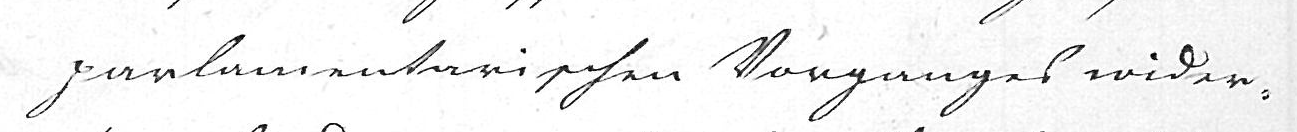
parlamentarischen Vorganges wider-
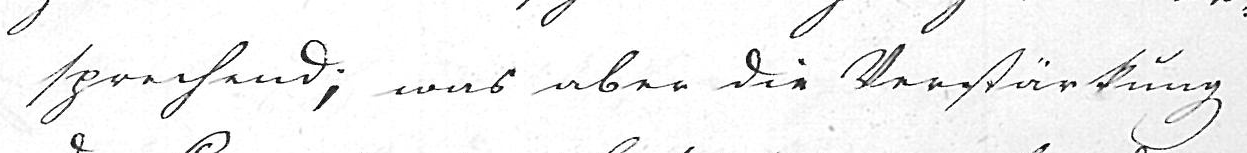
sprechend; was aber die Verstärkung
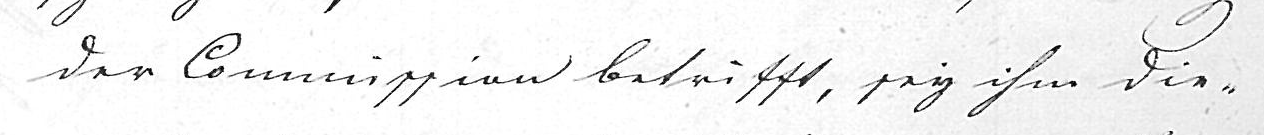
der Commission betrifft, sey ihm die-
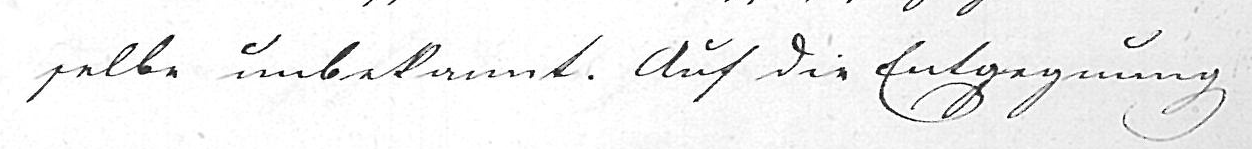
selbe bekannt. Auf die Entgegnung
